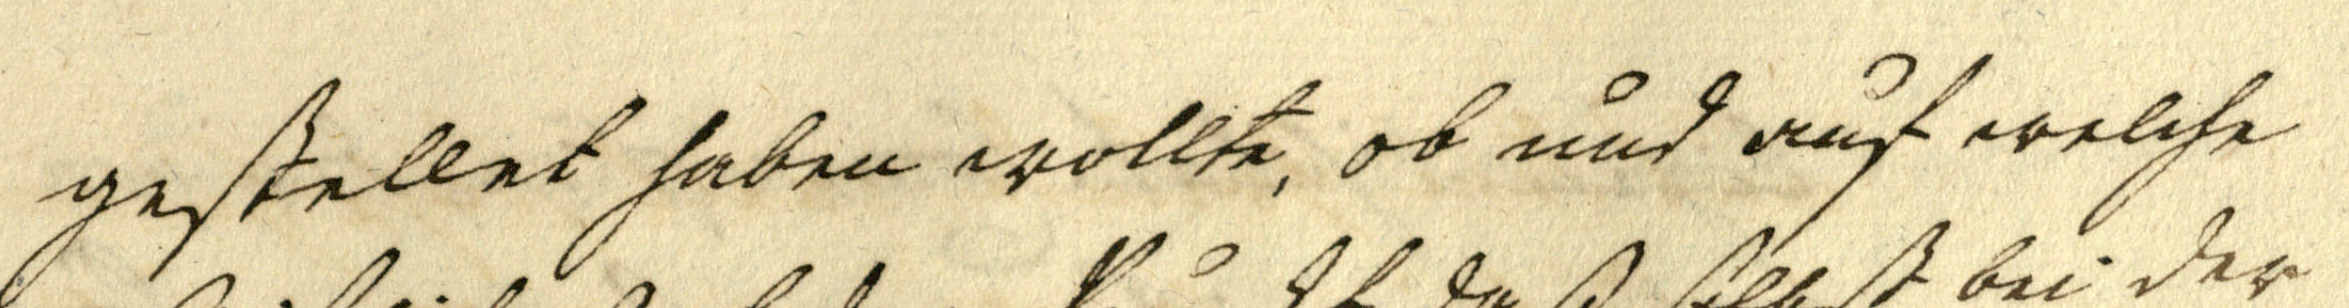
gestellet haben wollte, ob und auf welche
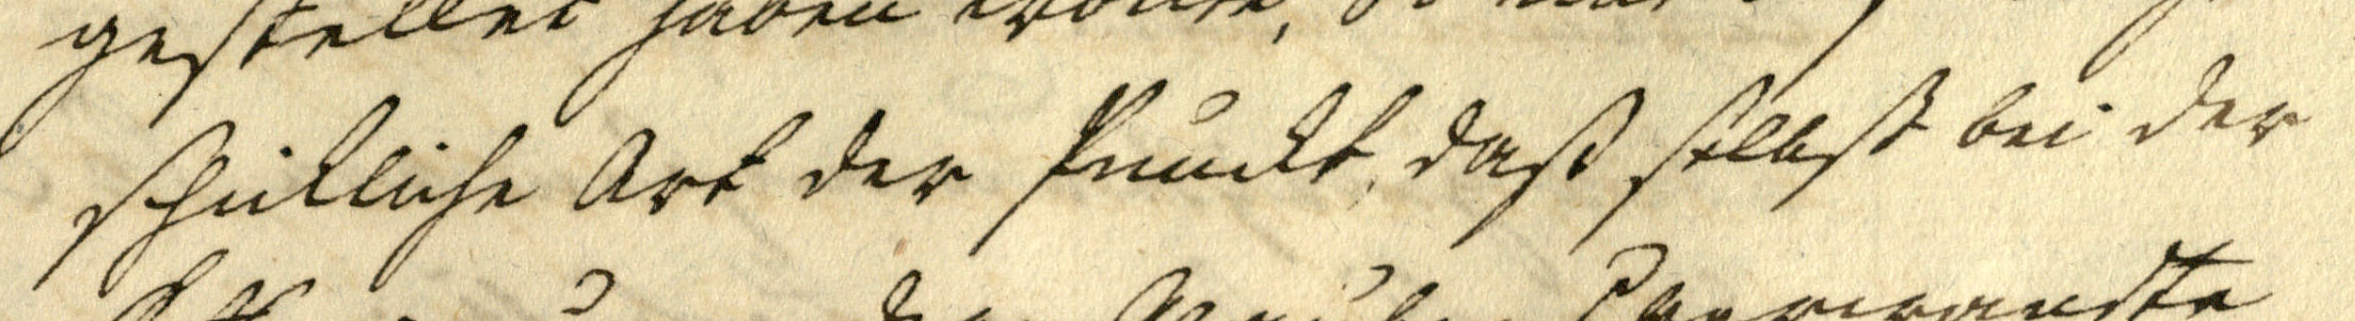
schickliche Art der Punckt daß selbst bei der
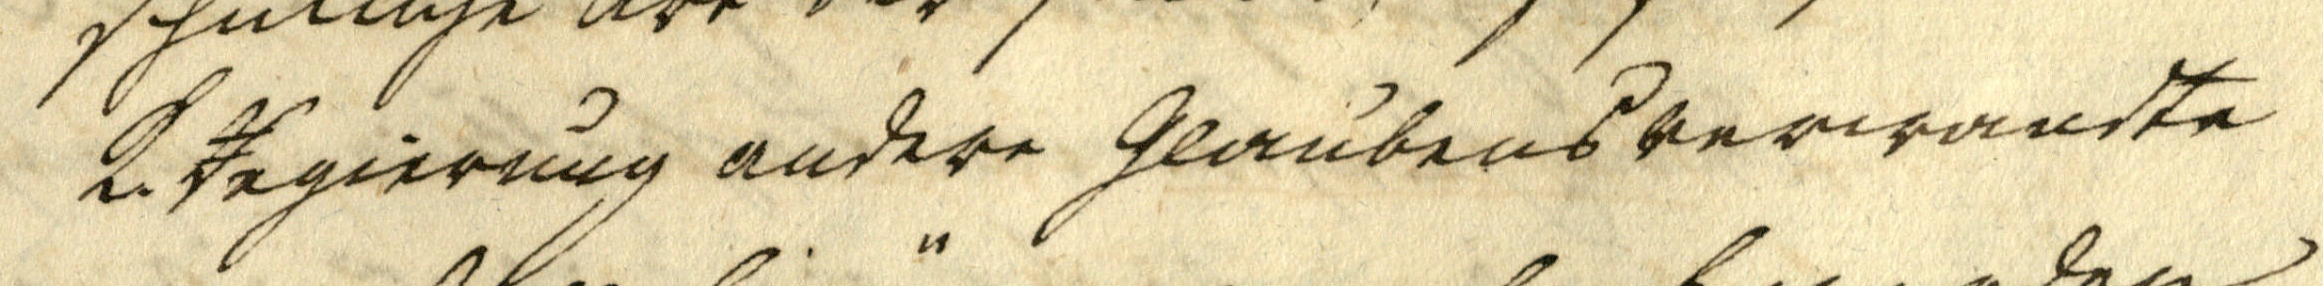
K. Regierung andere Glaubens verwandte
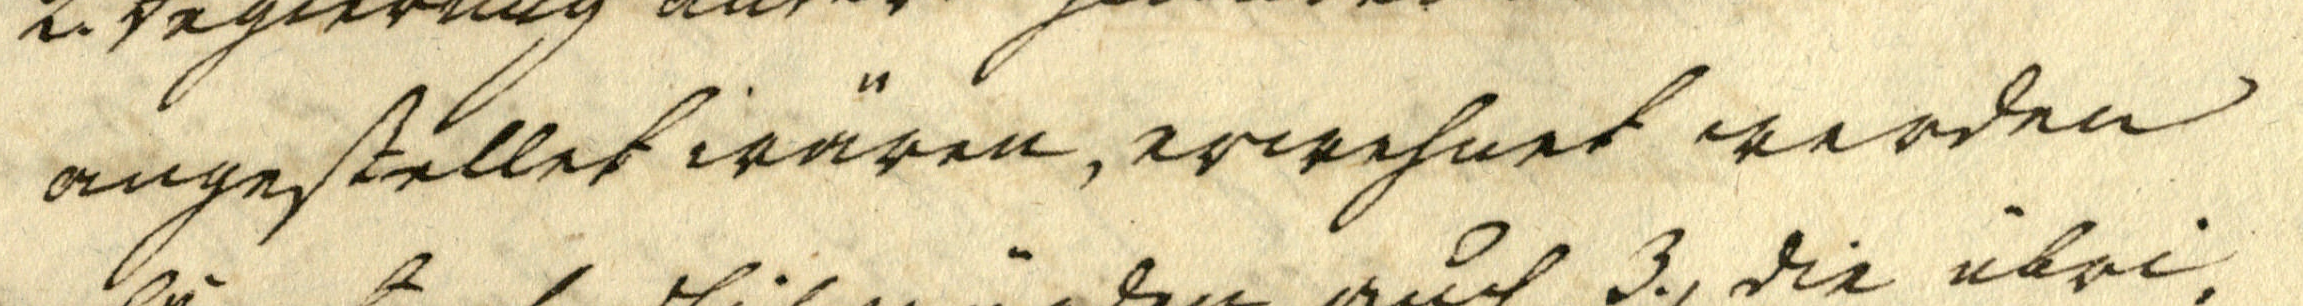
angestellet wären, erwehnet werden
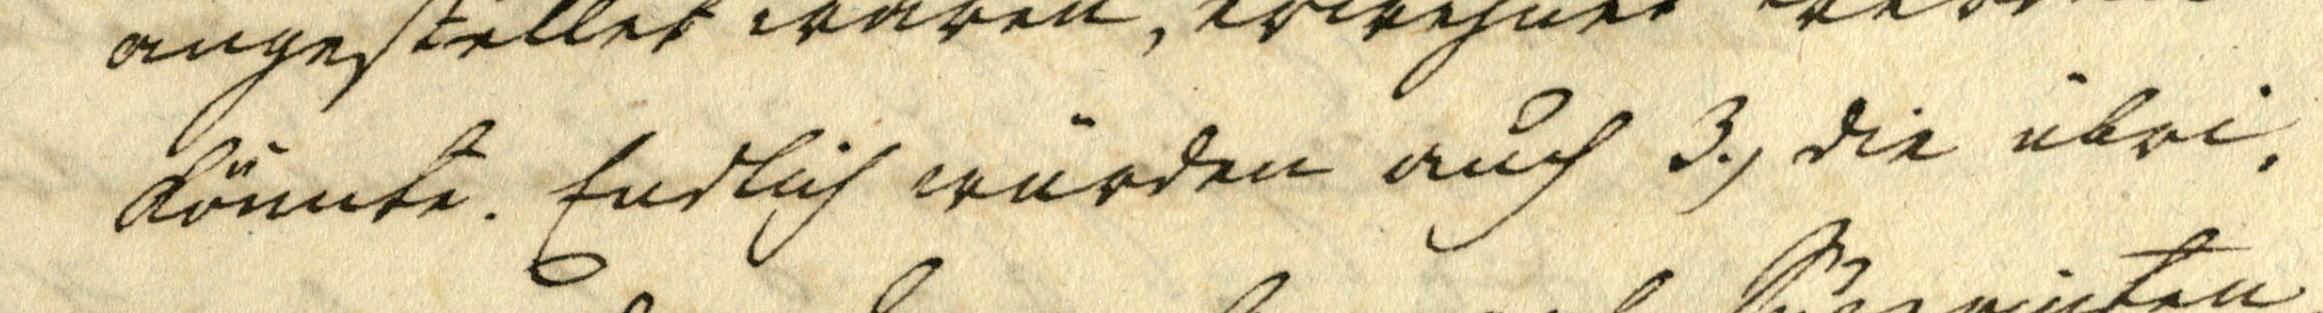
könnte. Endlich würden auch 3., die übri¬
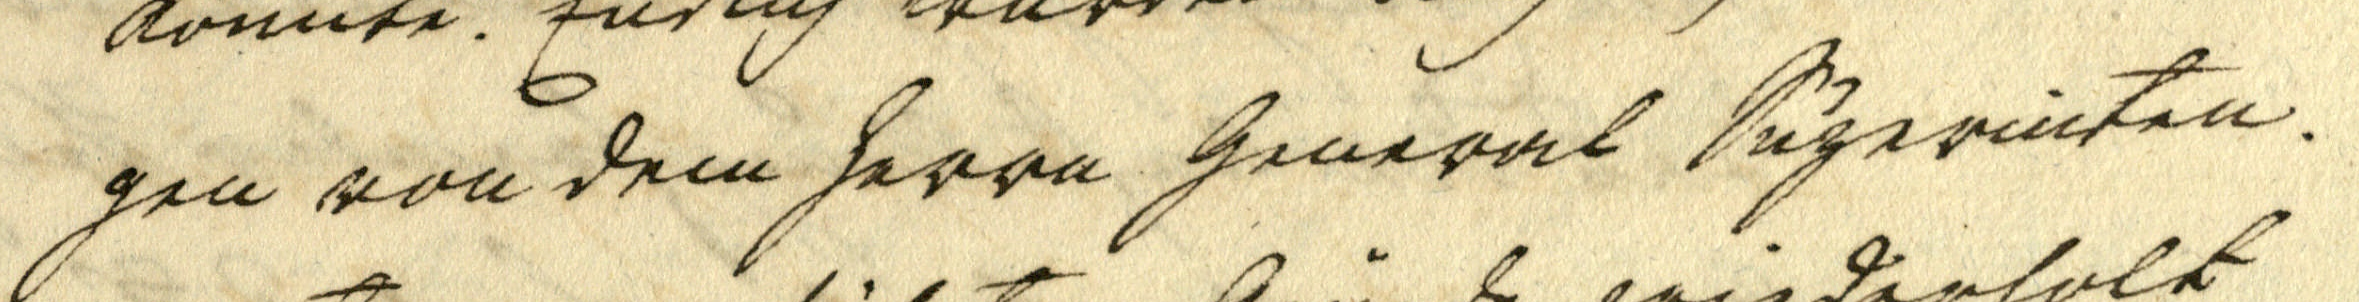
gen von dem Herrn General Superinten¬
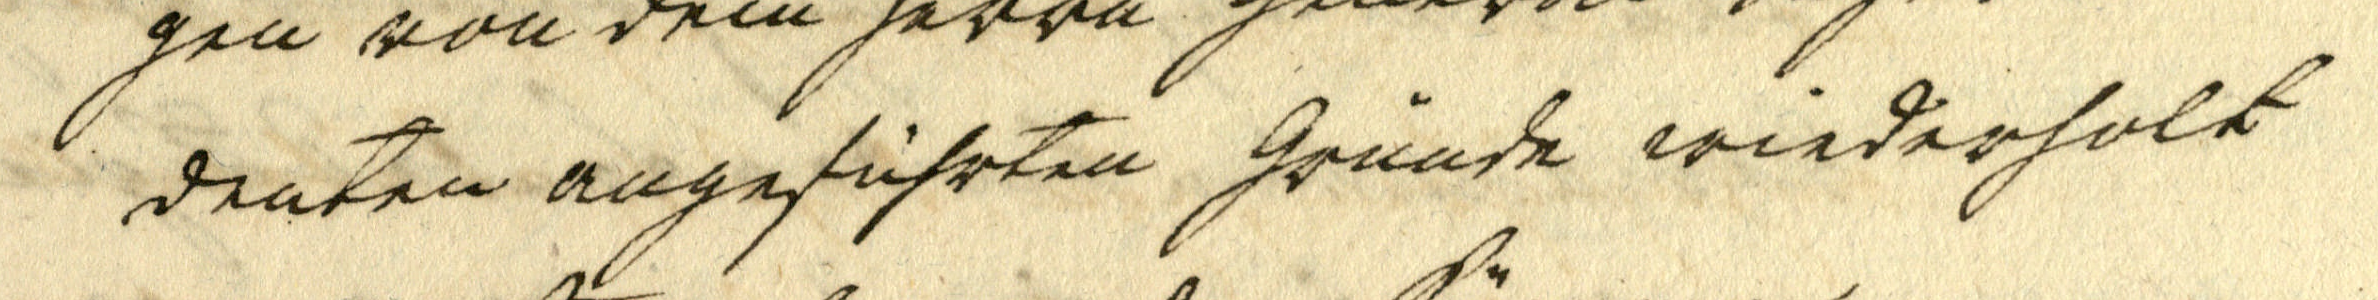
denten angeführten Gründe wiederholt
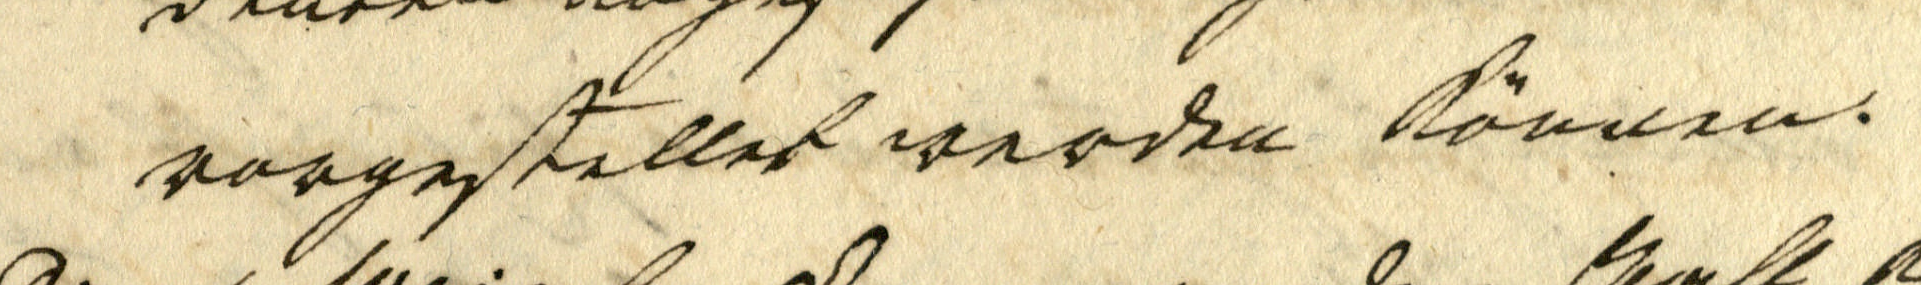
vorgestellet werden können.
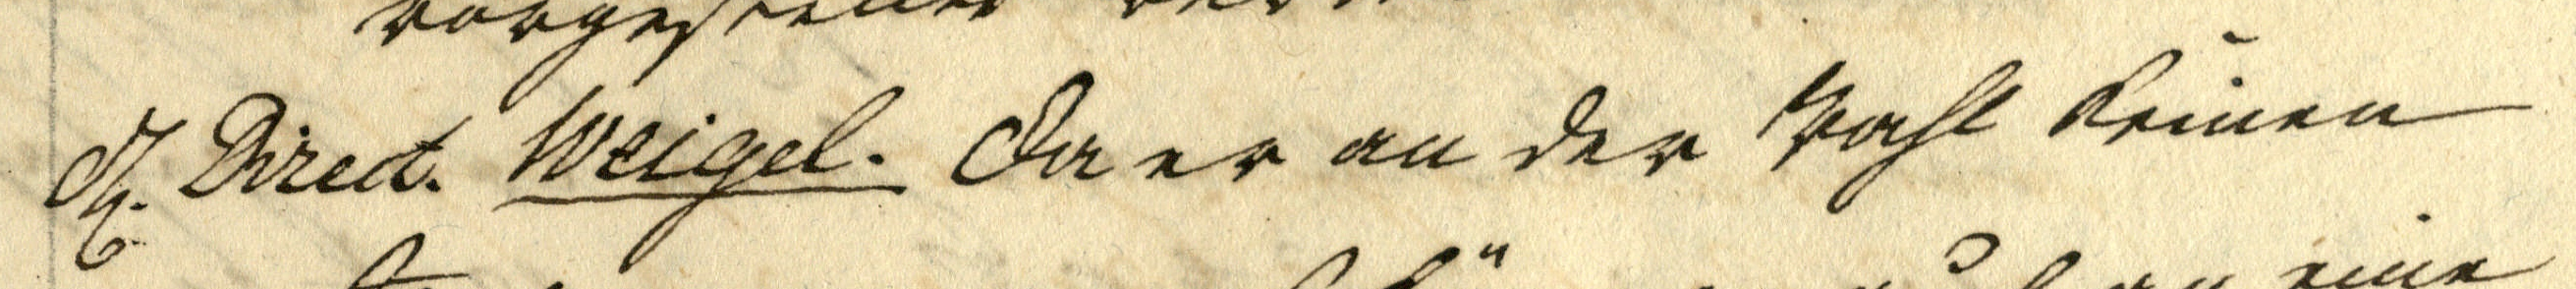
dh. Direct. Weigel. Da er an der Wahl keinen
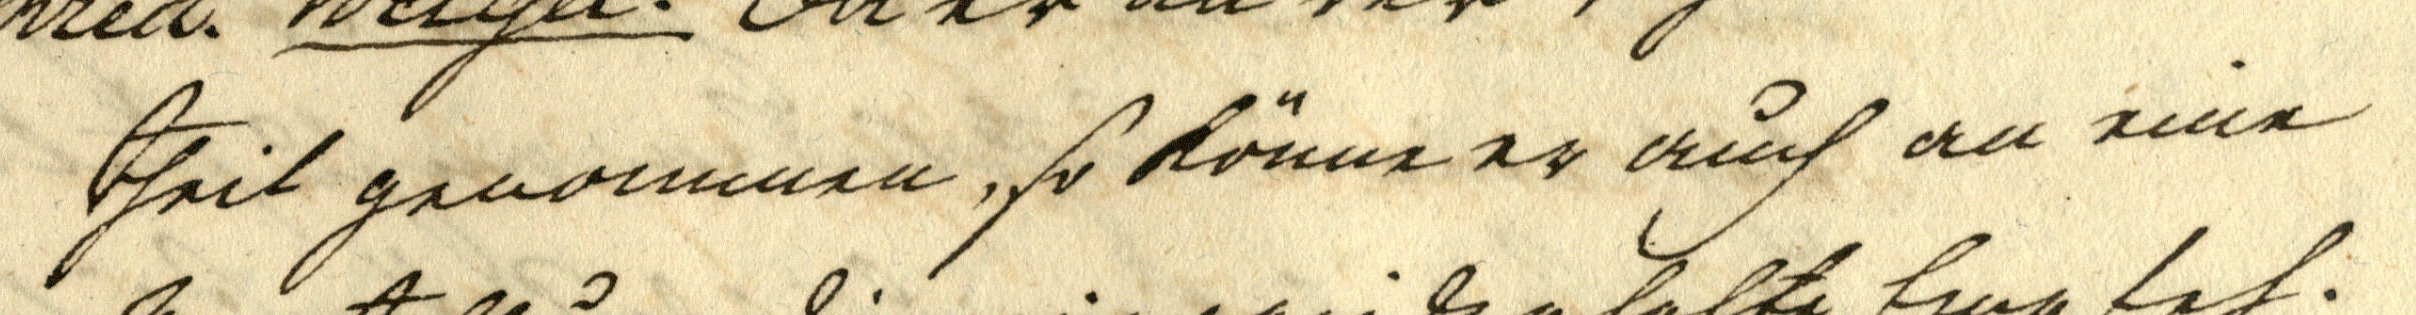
Theil genommen, so könne er auch an eine
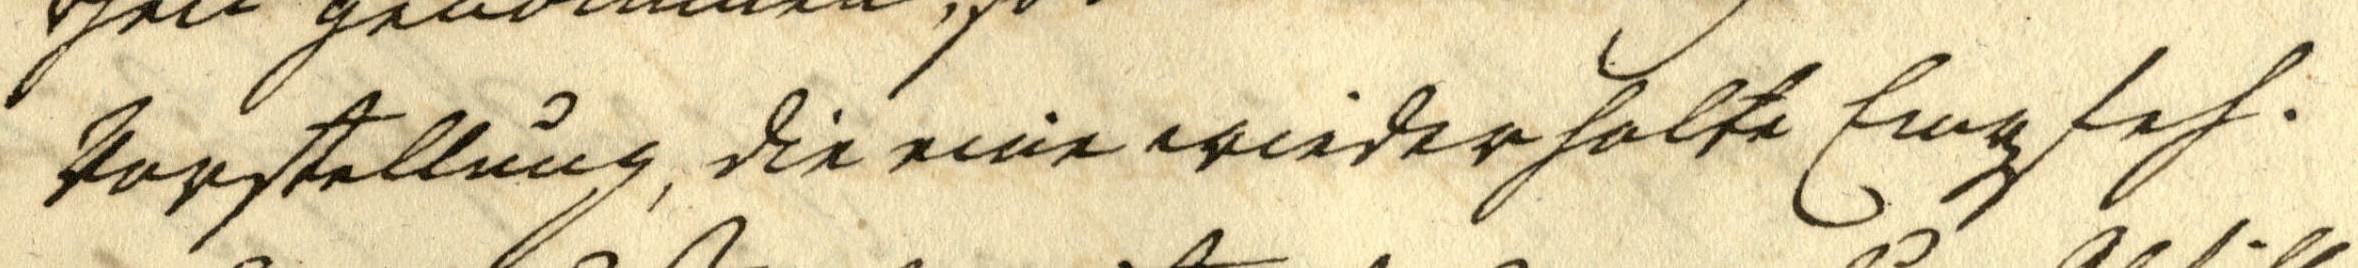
Vorstellung, die eine wiederholte Empfeh¬
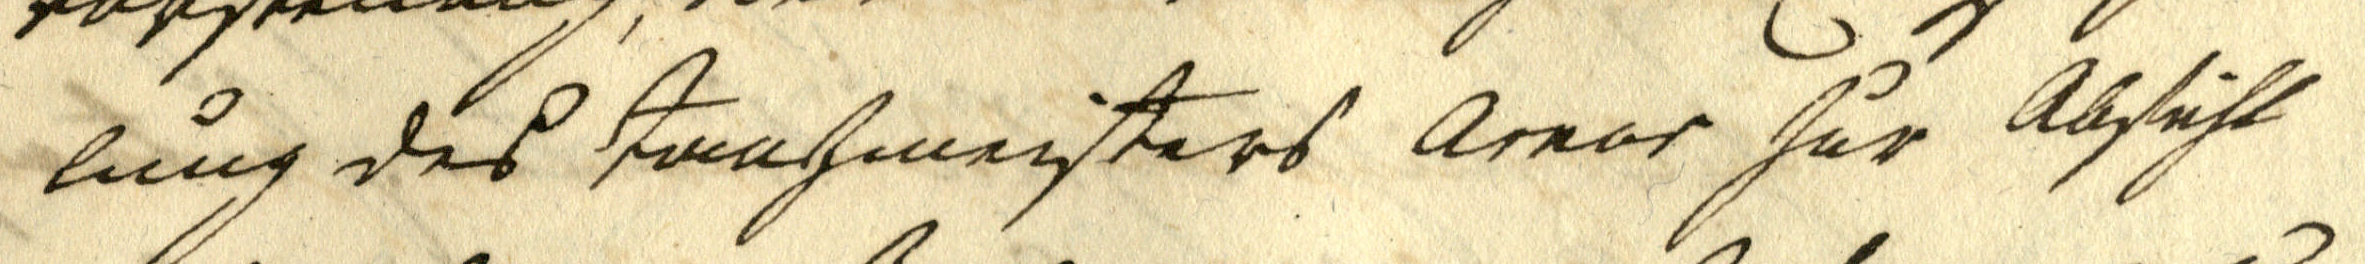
lung des Tanzmeisters Amor zur Absicht
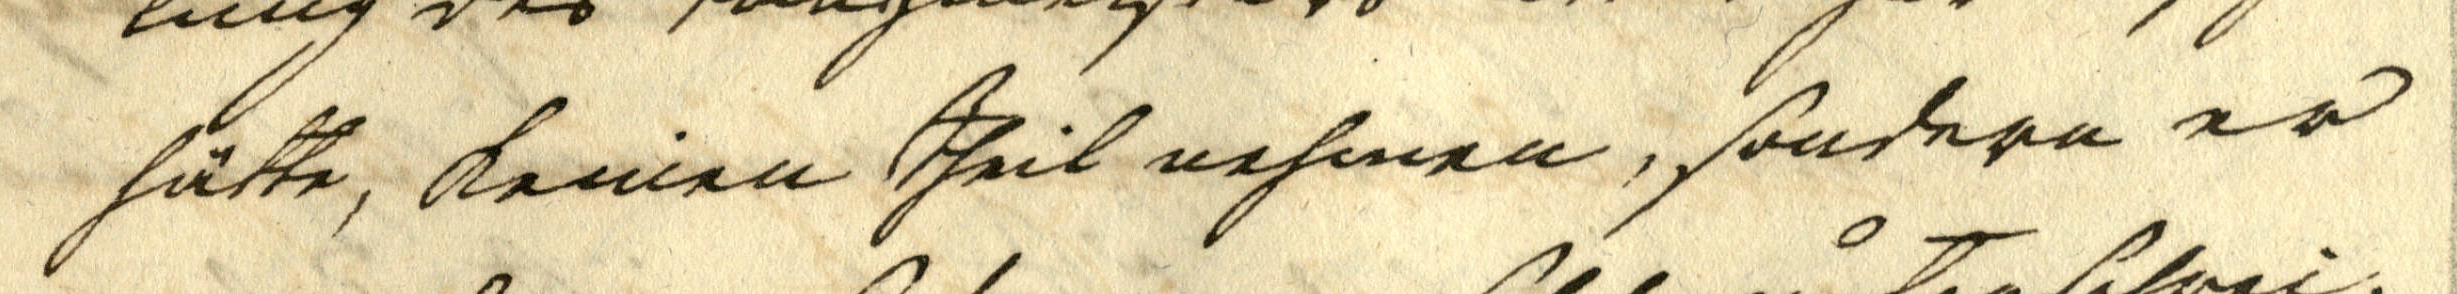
hätte, keinen Theil nehmen, sondern er
